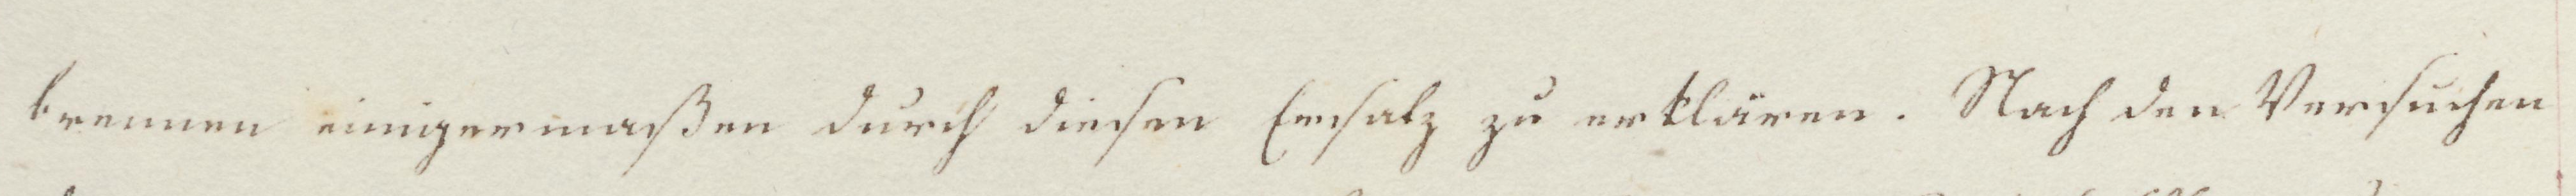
brennen einigermaßen durch diesen Ersatz zu erklären. Nach den Versuchen
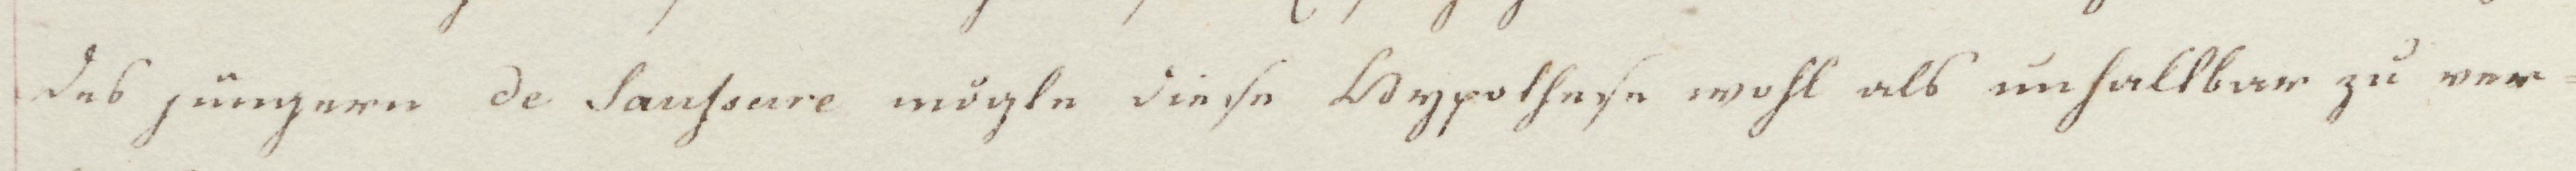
des jüngeren de Saussure mögte diese Hypothese wohl als unhaltbar zu ver-
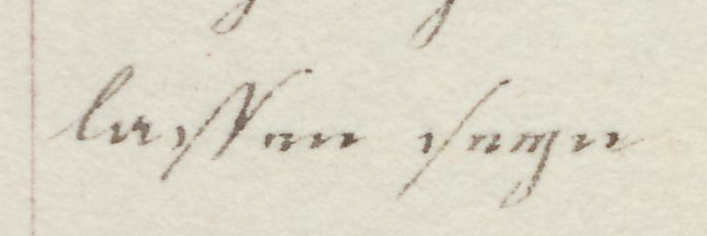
lassen seyn.
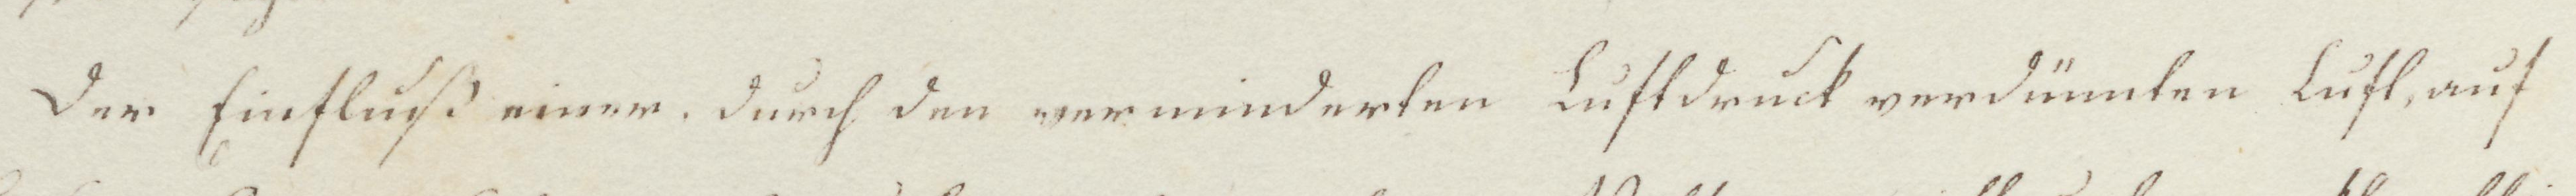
Der Einfluß einer, durch den verminderten Luftdruck verdünnten Luft, auf
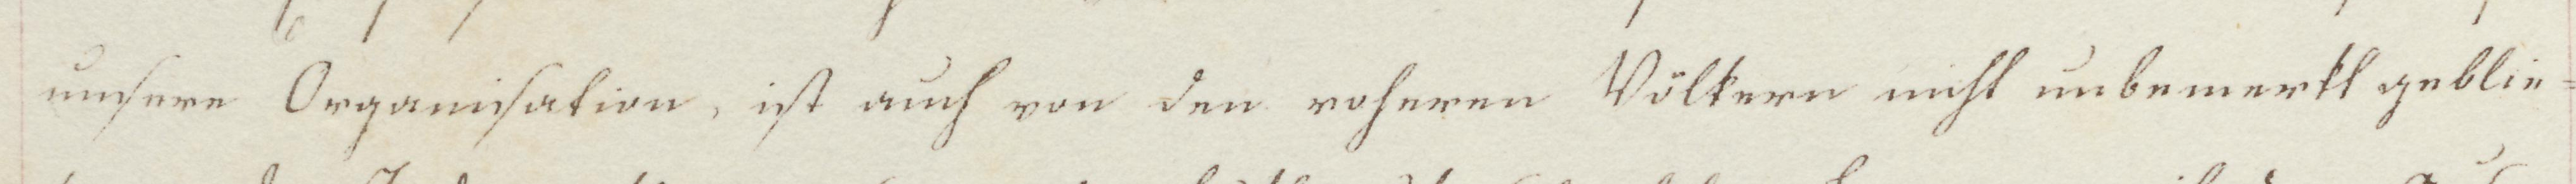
unsere Organisation, ist auch von den roheren Völkern nicht unbemerkt geblie-
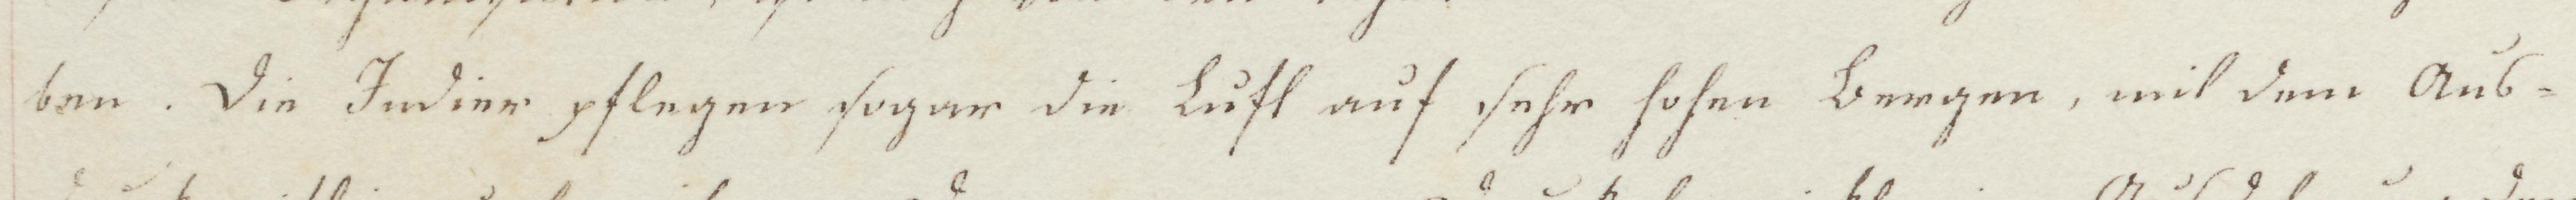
ben. Die Indier pflegen sogar die Luft auf sehr hohen Bergen, mit dem Aus-
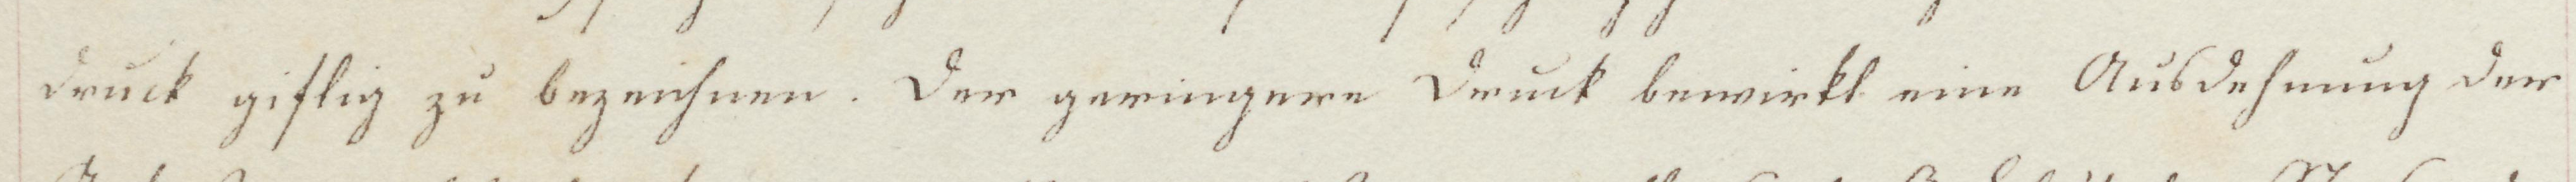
druck giftig zu bezeichnen. Der geringere Druck bewirkt eine Ausdehnung der
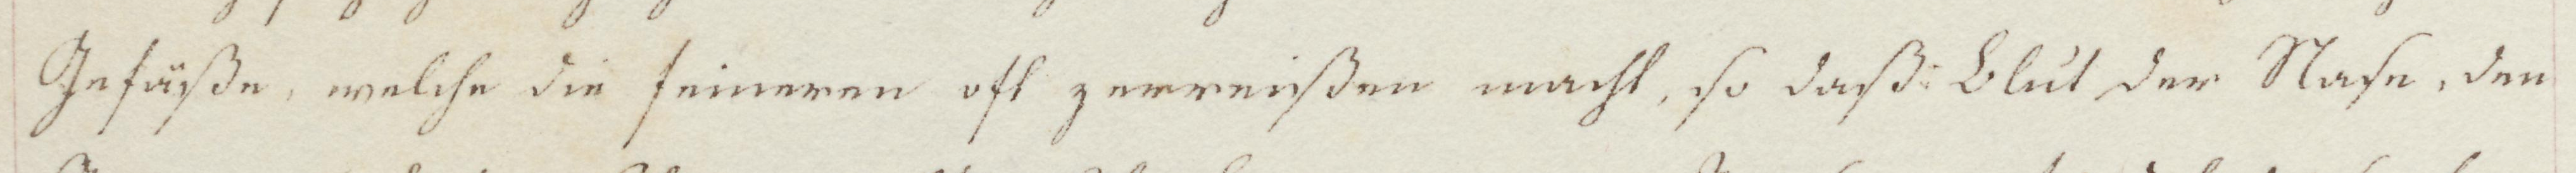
Gefäße, welche die feineren oft zerreißen macht, so daß Blut der Nase, den
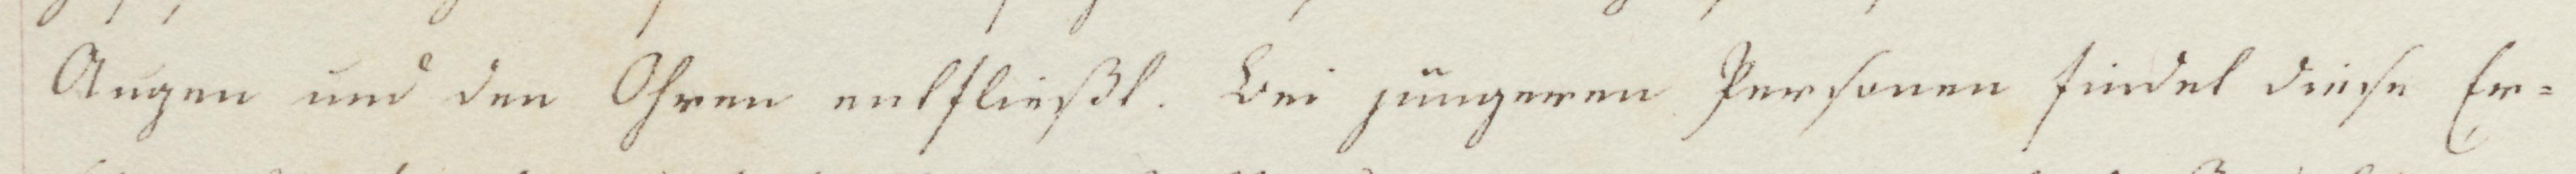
Augen und den Ohren entfließt. Bei jüngeren Personen findet diese Er-
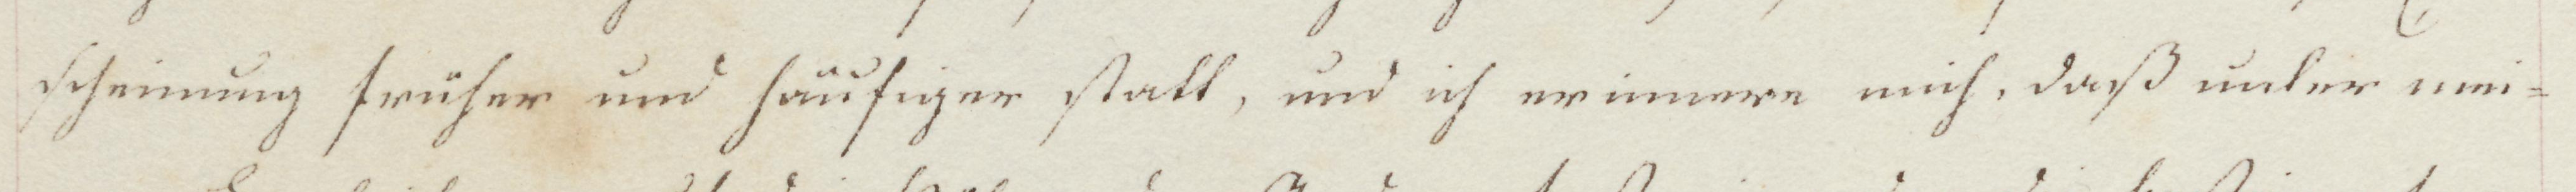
scheinung früher und häufiger statt, und ich erinnere mich, daß unter mei-
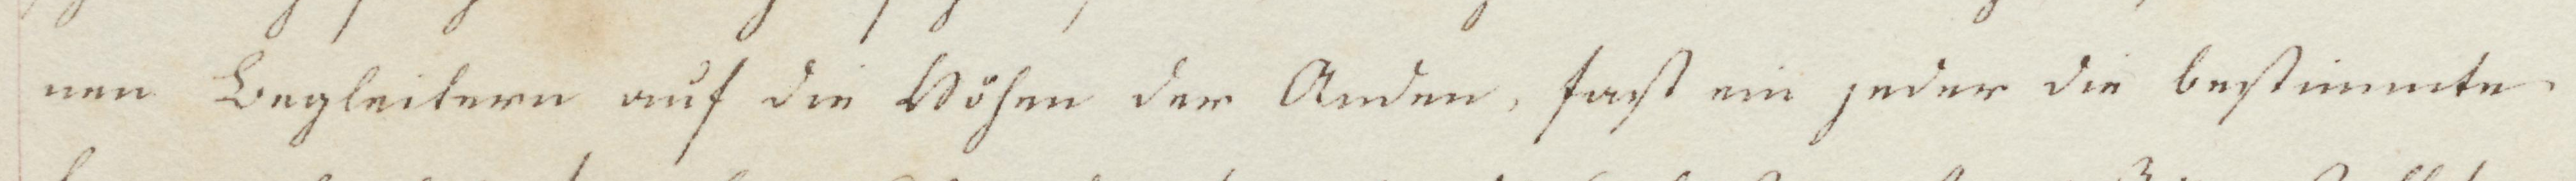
nen Begleitern auf die Höhen der Anden, fast ein jeder die bestimmte
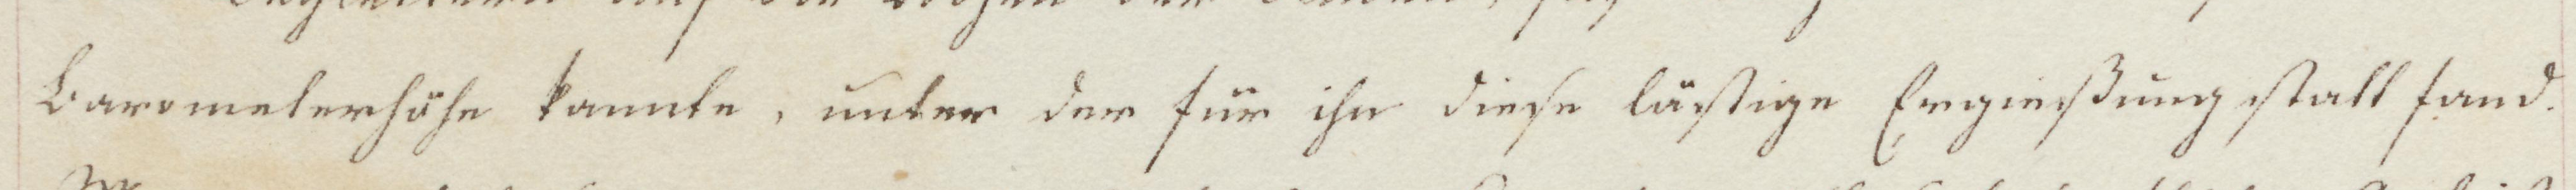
Barometerhöhe kannte, unter der für ihn diese lästige Ergießung statt fand.
